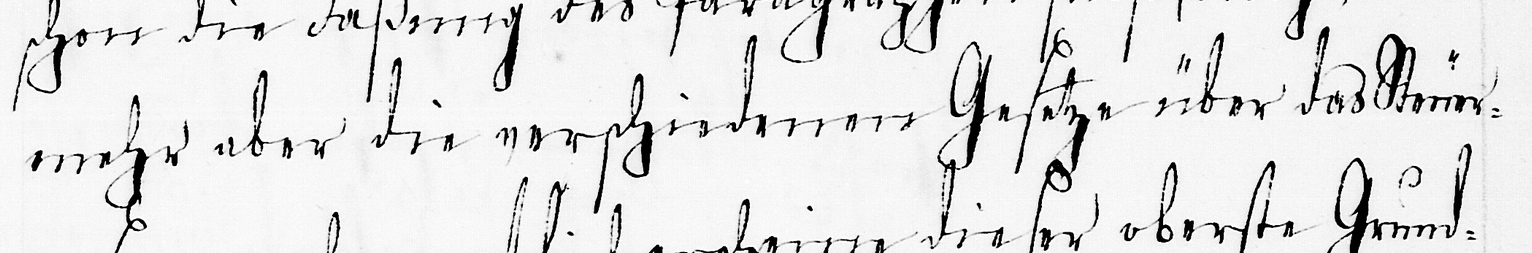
mehr aber die verschiedenen Gesetze über das Steuer¬
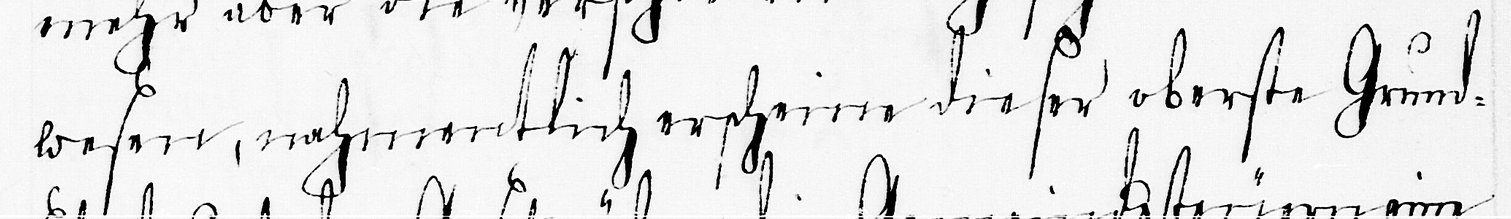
wesen, nahmentlich erscheine dieser oberste Grund¬
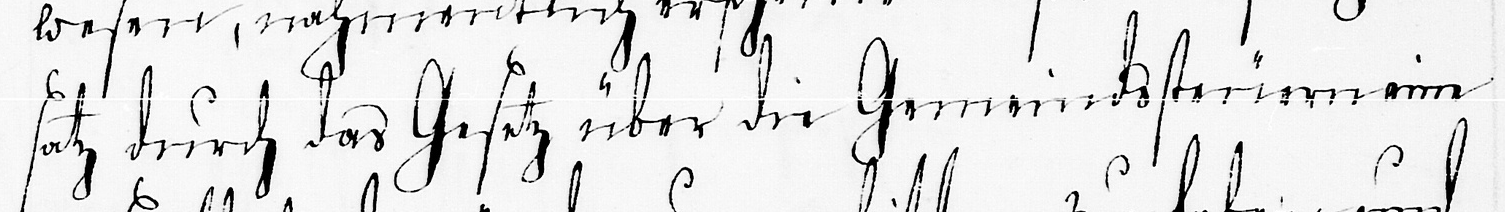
satz durch das Gesetz über die Gemeindssteuern eine
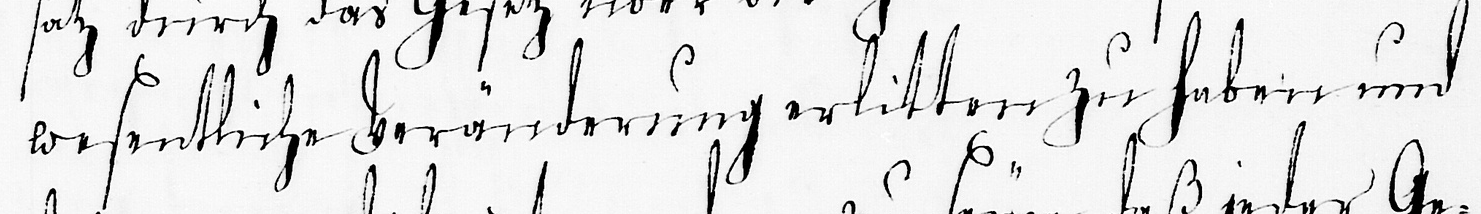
wesentliche Veränderung erlitten zu haben und
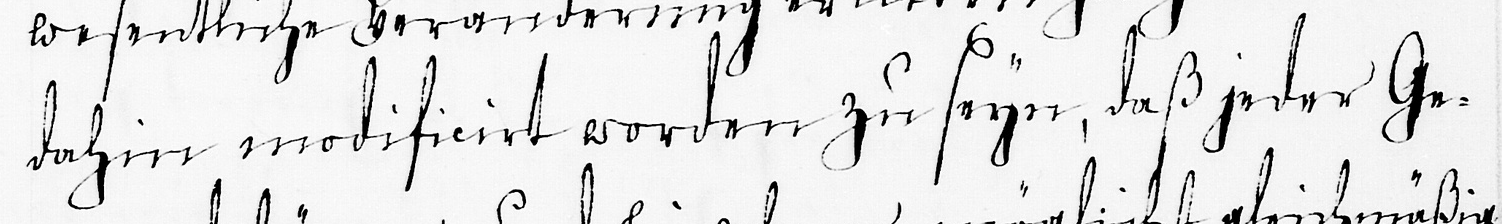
dahin modificirt worden zu seyn, daß jeder Ge¬
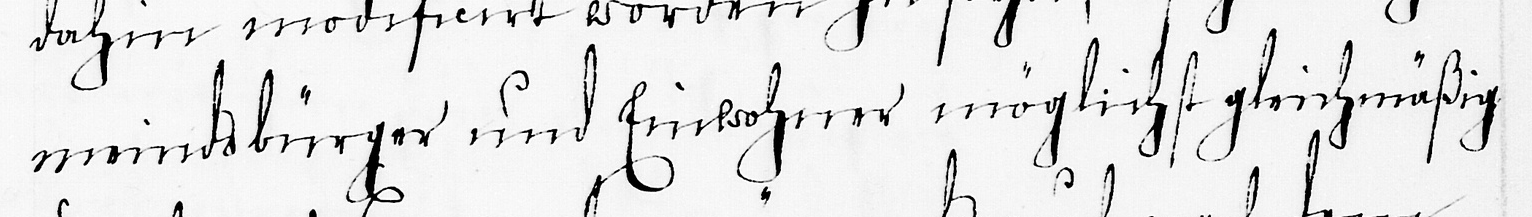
meindsbürger und Einwohner möglichst gleichmäßig
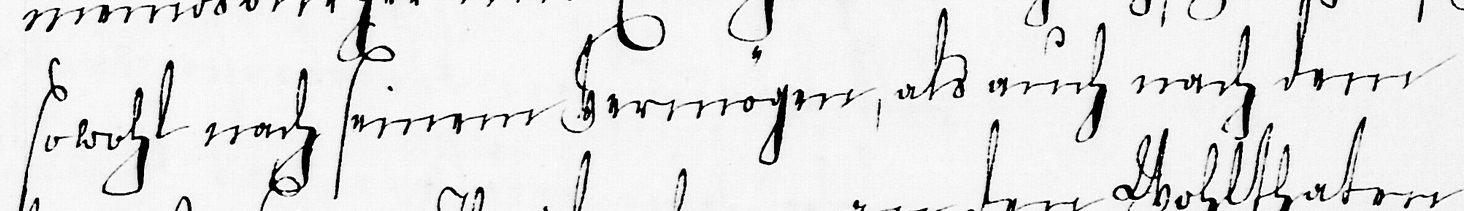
sowohl nach seinem Vermögen, als auch nach dem
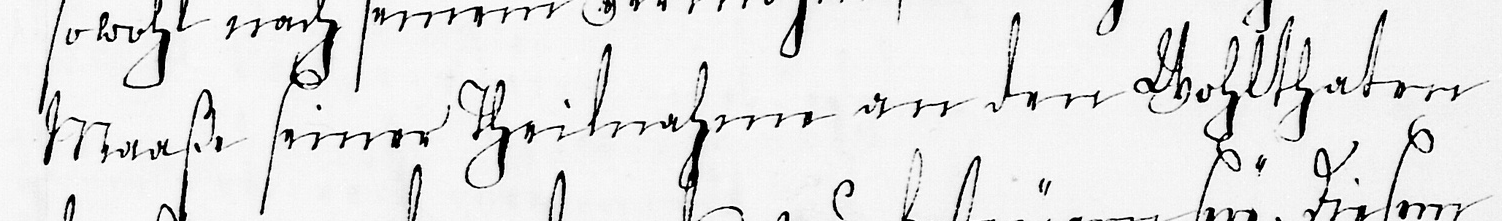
Maaße seiner Theilnahme an den Wohlthaten
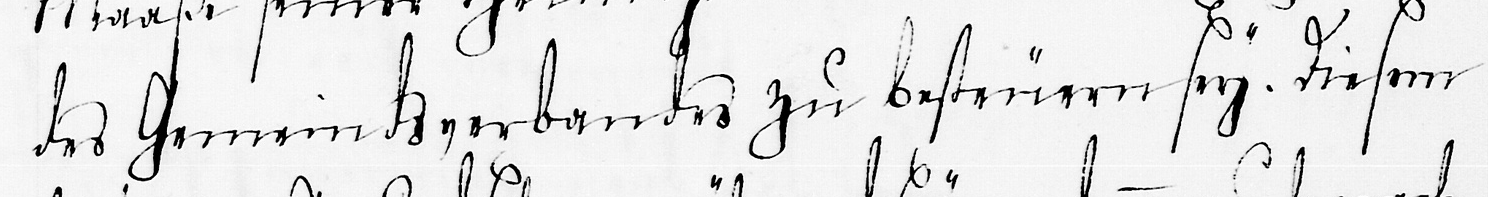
des Gemeindsverbandes zu besteuern sey. Diesem
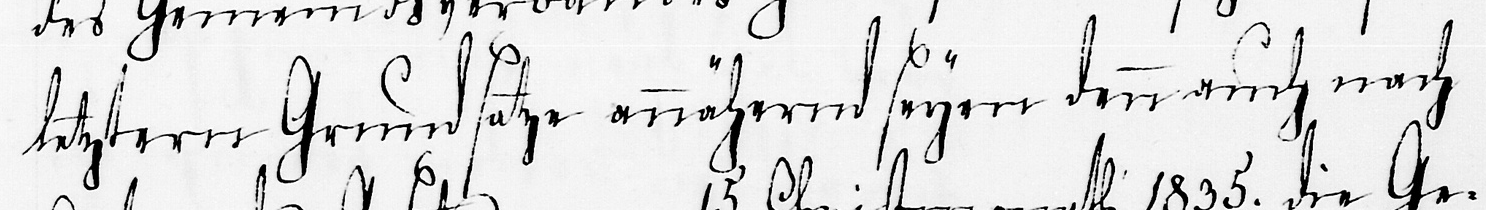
letztern Grundsatze annähernd seyen denn auch nach
